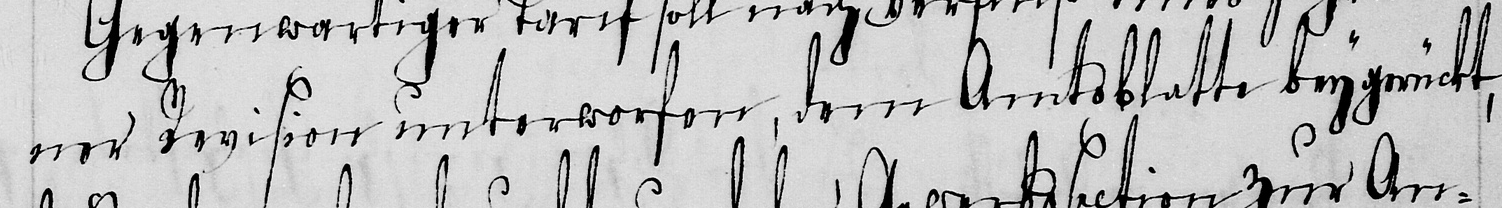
ner Revision unterworfen, dem Amtsblatte beygerückt,
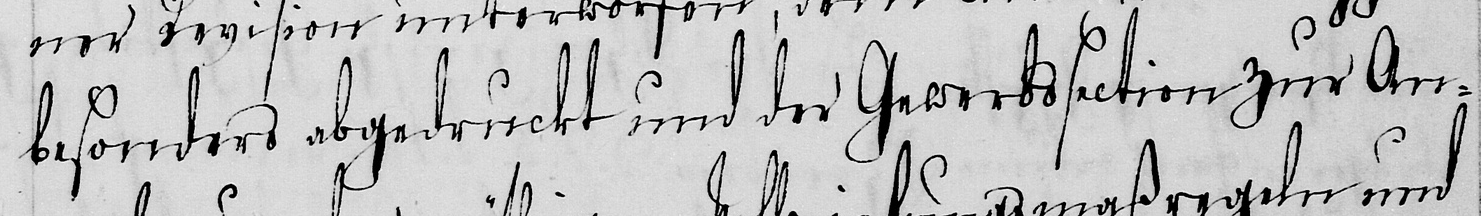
besonders abgedruckt und der Gewerbssection zur An¬
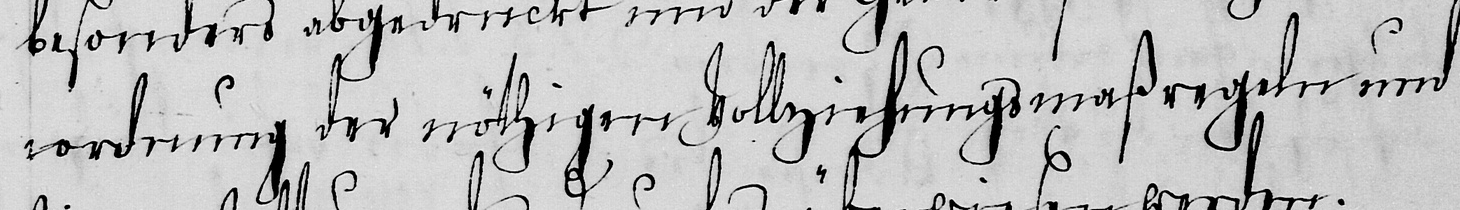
ordnung der nöthigen Vollziehungsmaßregeln und
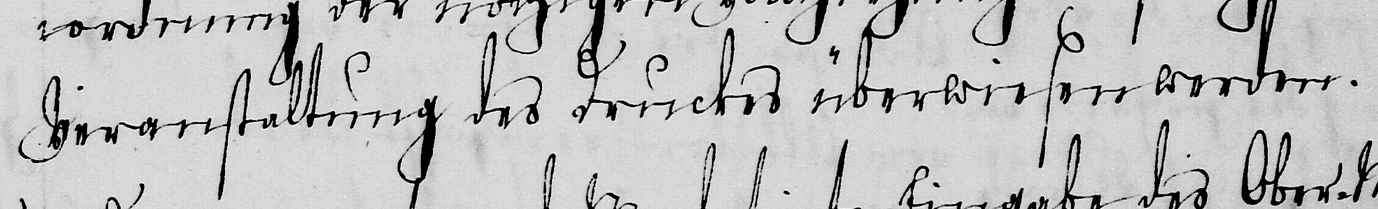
Veranstaltung des Druckes überwiesen werden.
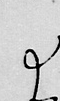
56.
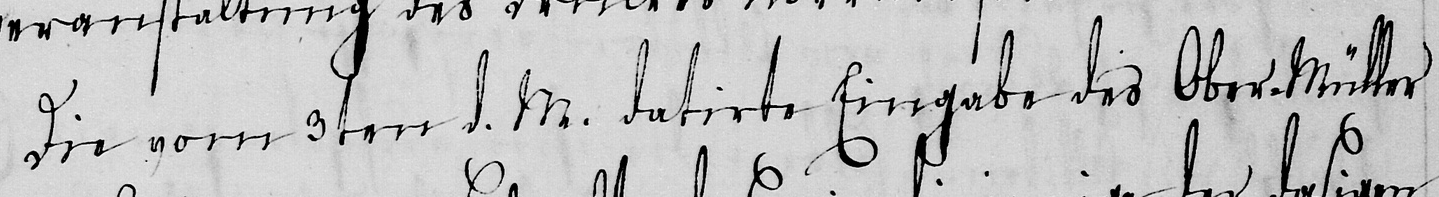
Die vom 3ten d. M. datirte Eingabe des Ober-Müller
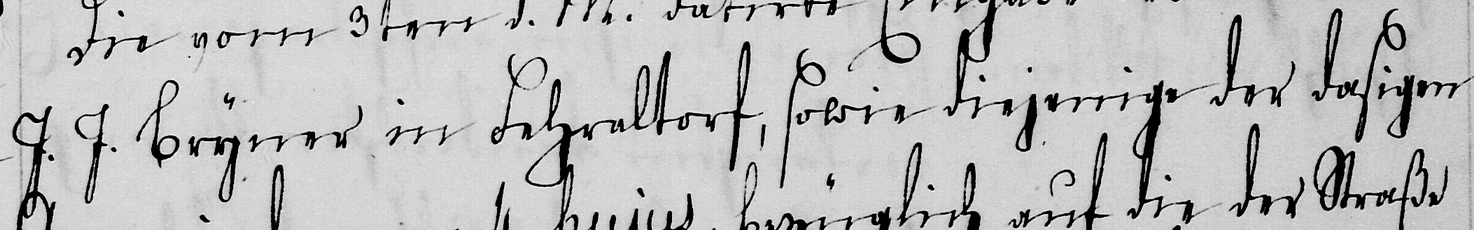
J. J. Bryner in Fehraltorf, sowie diejenige der dasigen
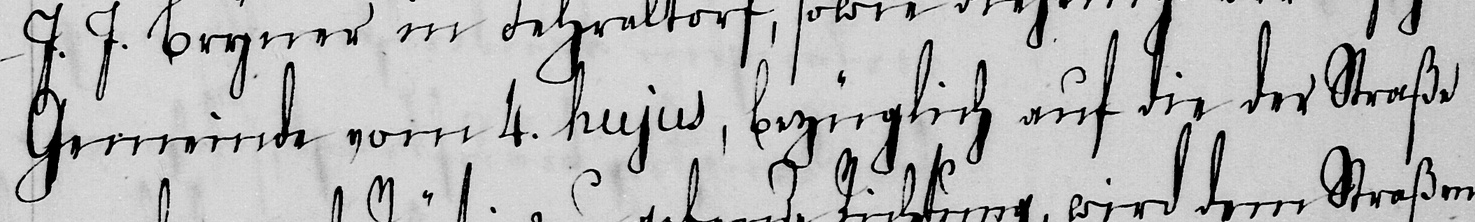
Gemeinde vom 4. hujus, bezüglich auf die der Straße
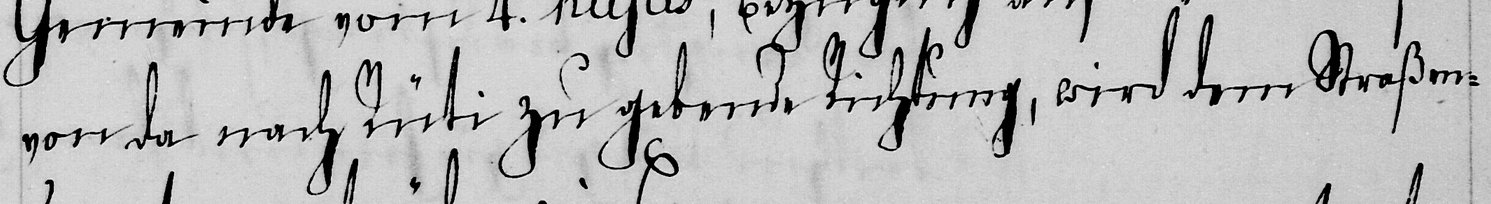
von da nach Rüti zu gebende Richtung, wird dem Straße¬
